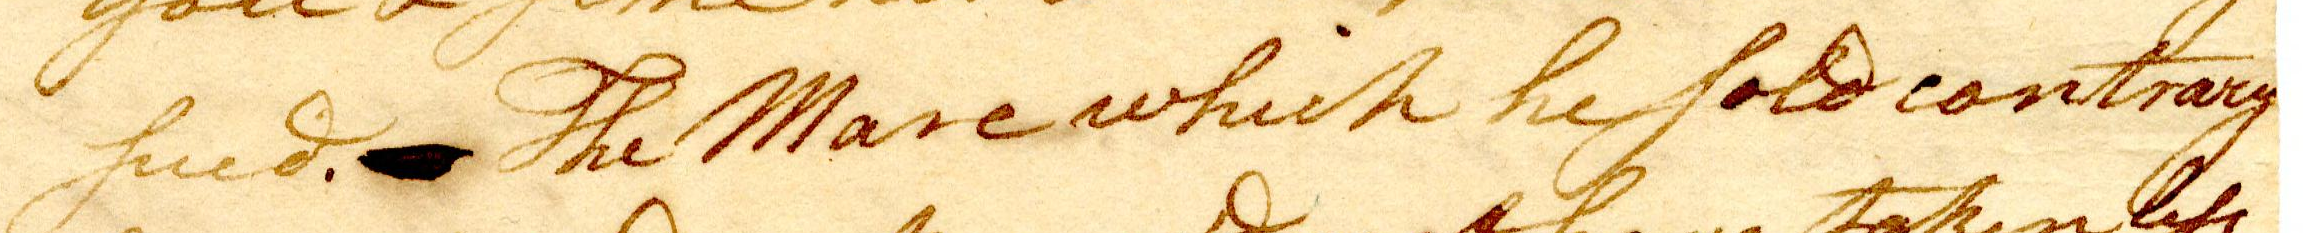sued. The Mare which he sold contrary
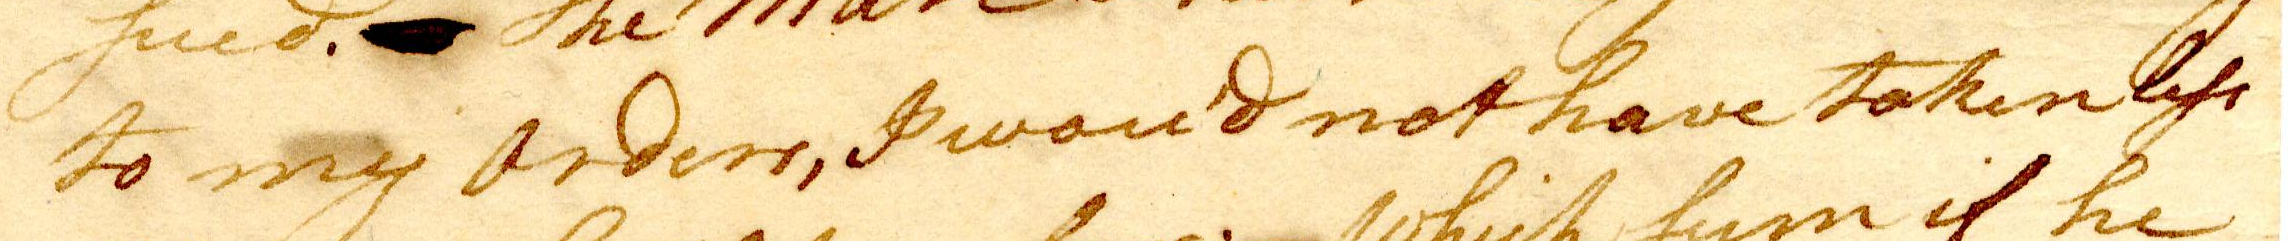to my orders, I wou'd not have taken less
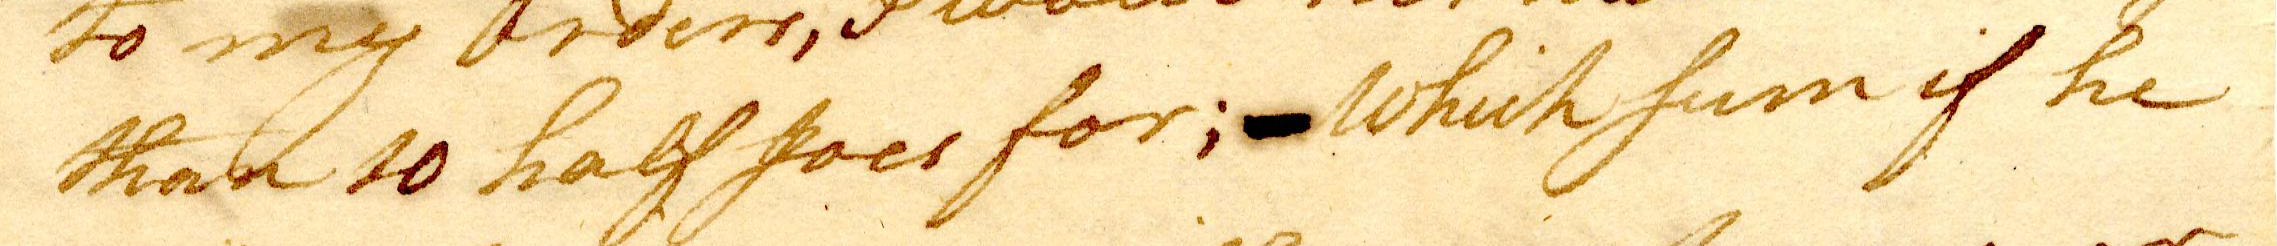than 10 half goes for; Which sum if he
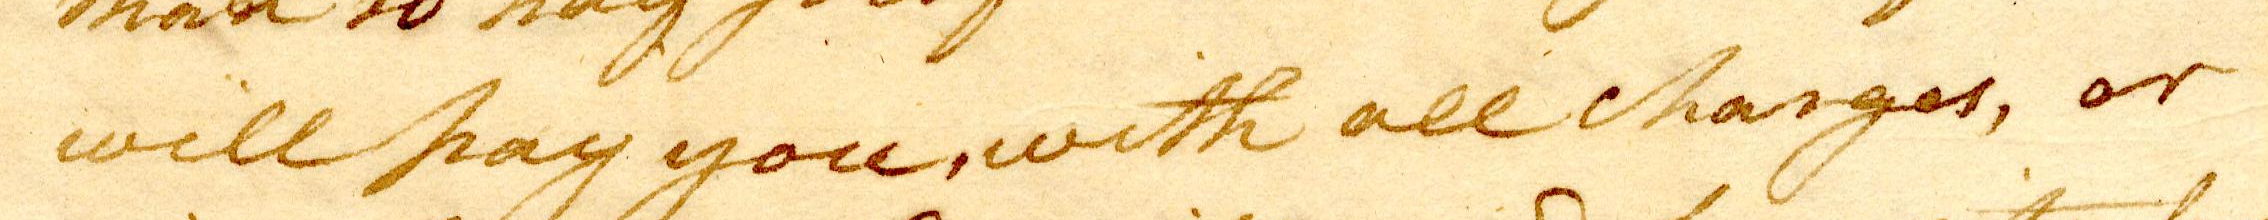will pay you, with all charges, or
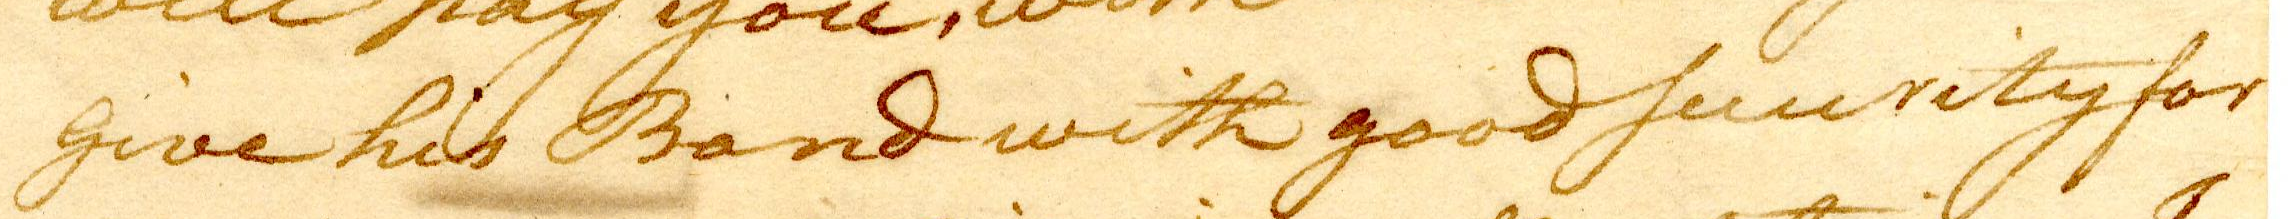give his Bond with good security for
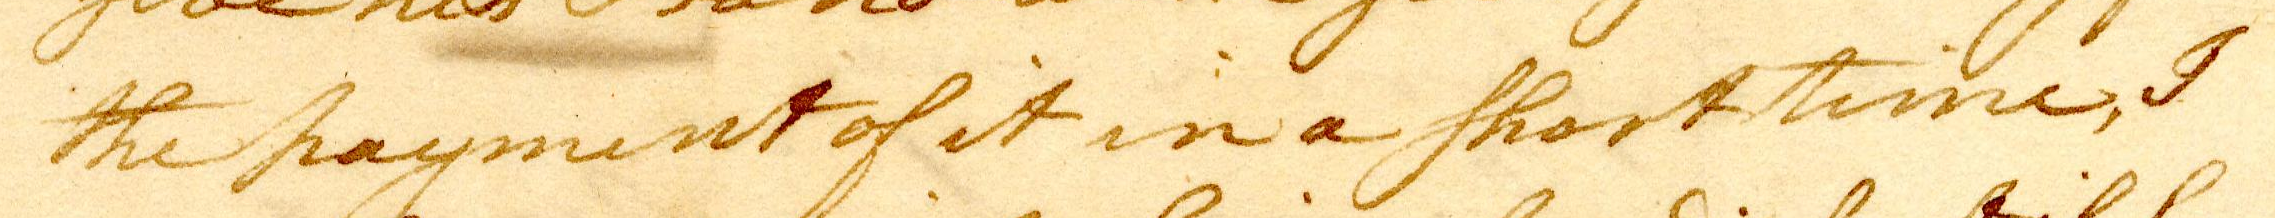the payment of it in a short time, I
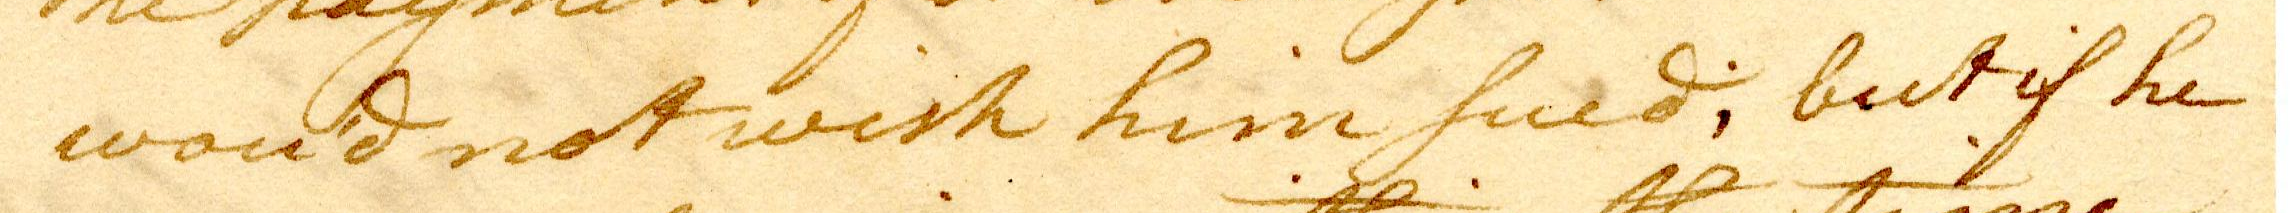wou'd not wish him sued; but if he
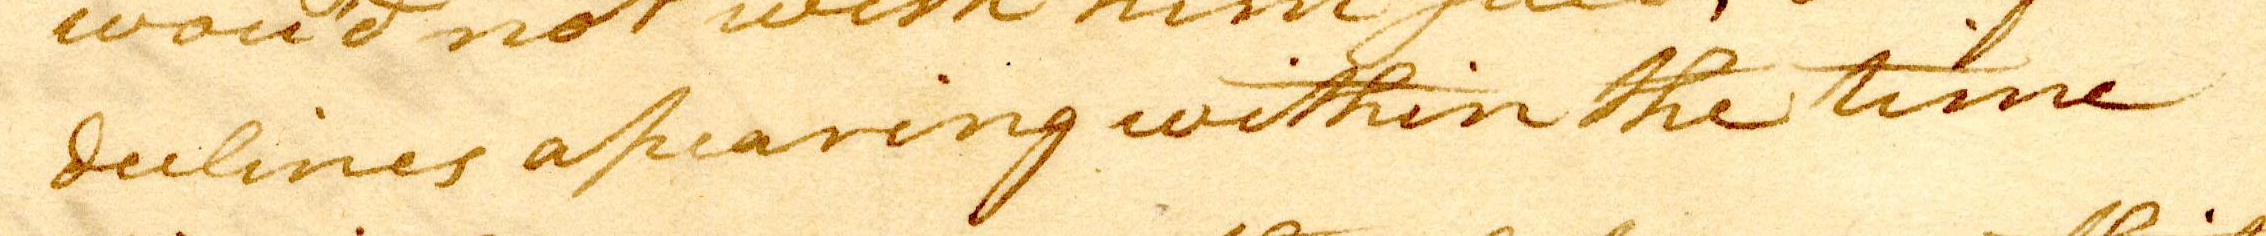declines apearing within the time
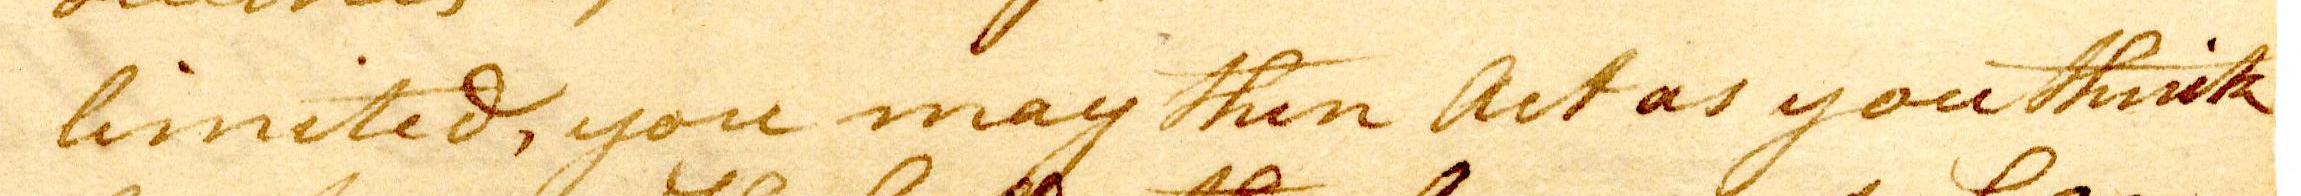limited, you may then Act as you think
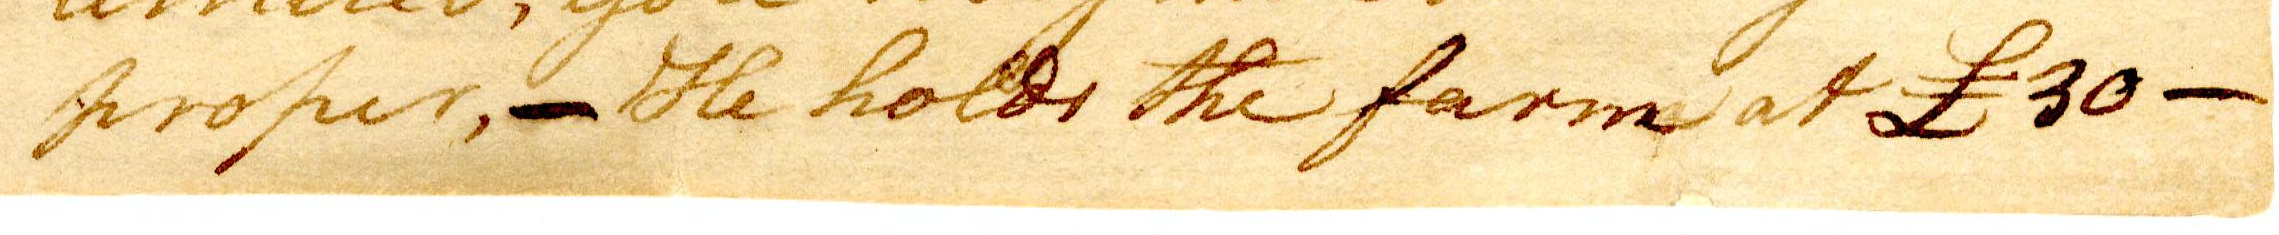proper, He holds the farm at £30
